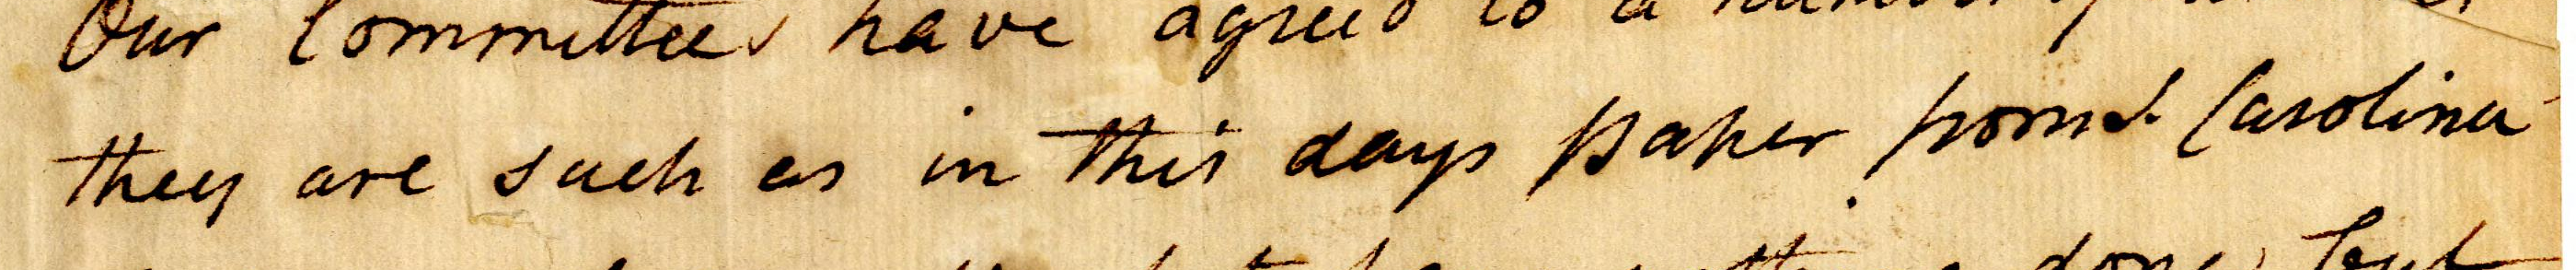they are such as in this days paper from S. Carolina
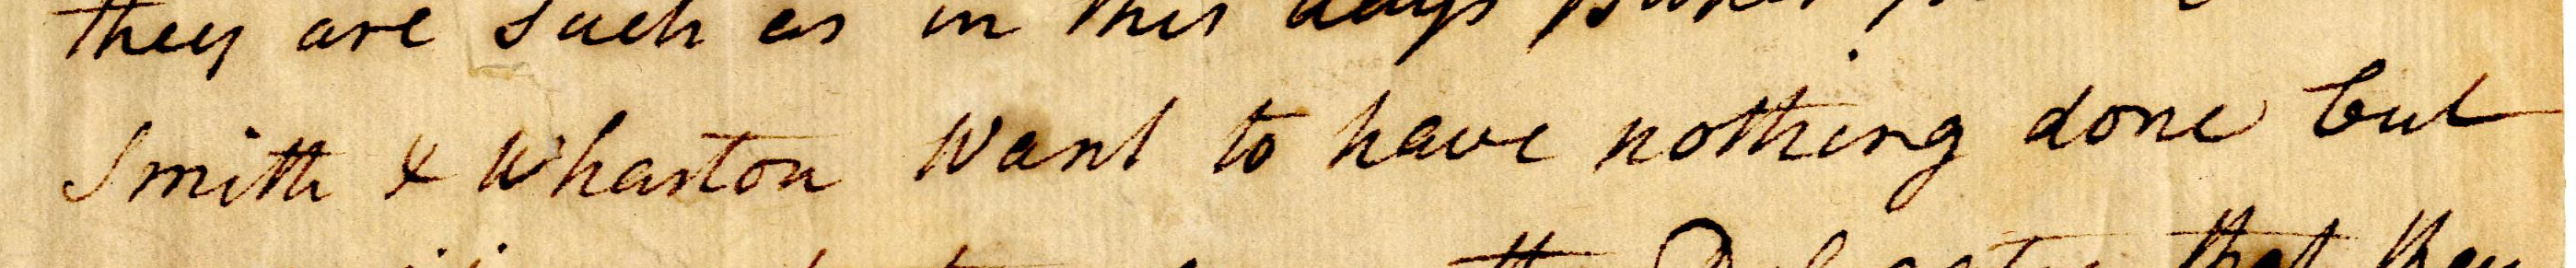Smith & Wharton Want to have nothing done but
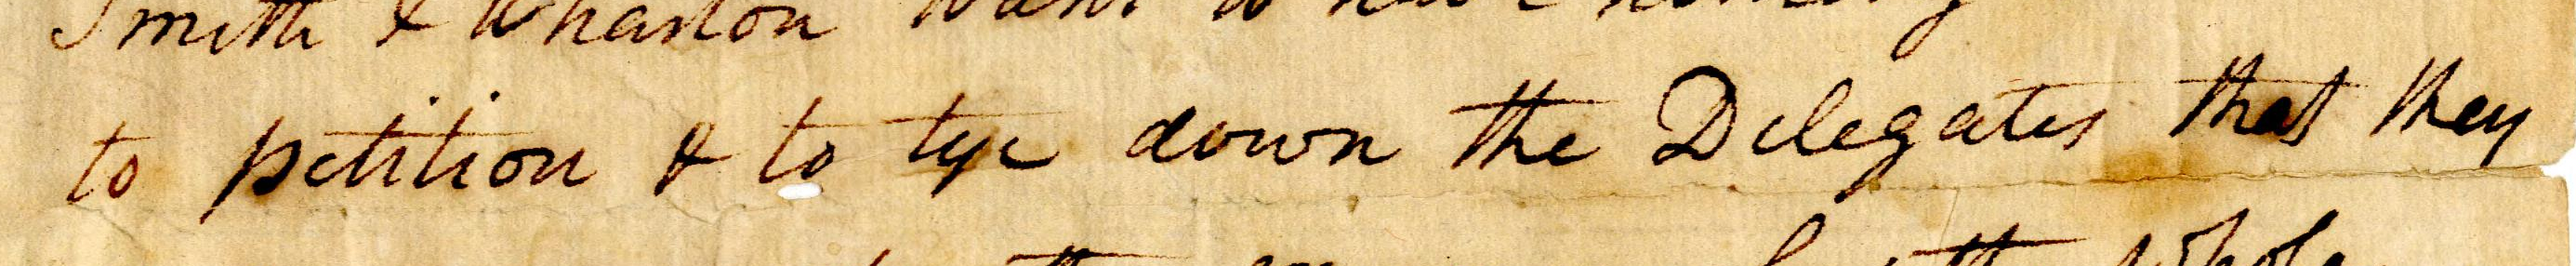to petition & to tye down the Delegates that they
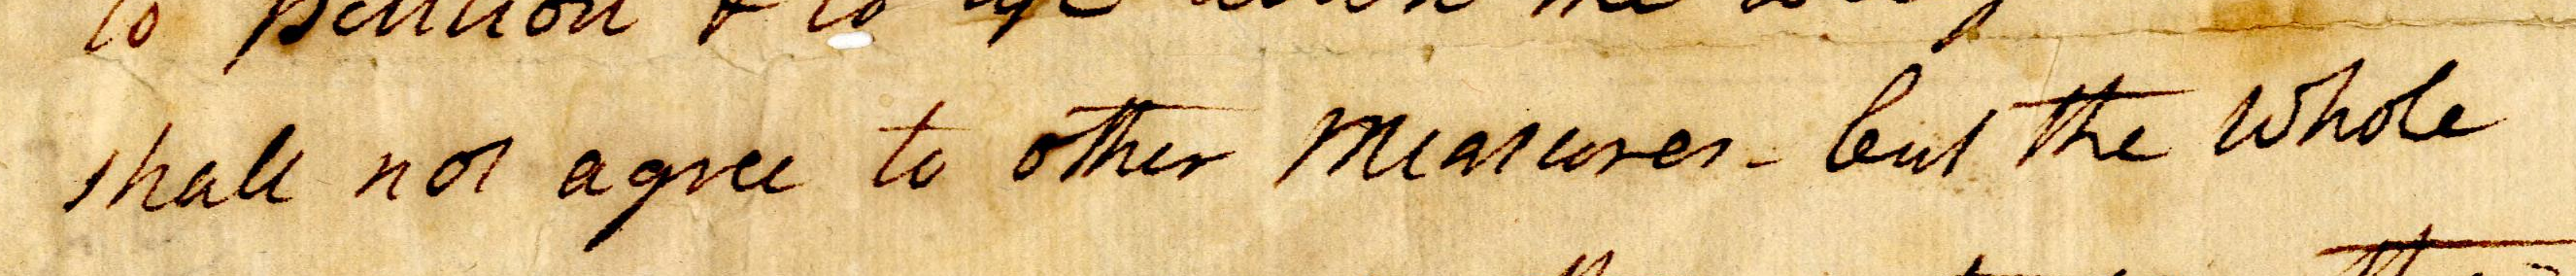shall not agree to other Measures- but the whole
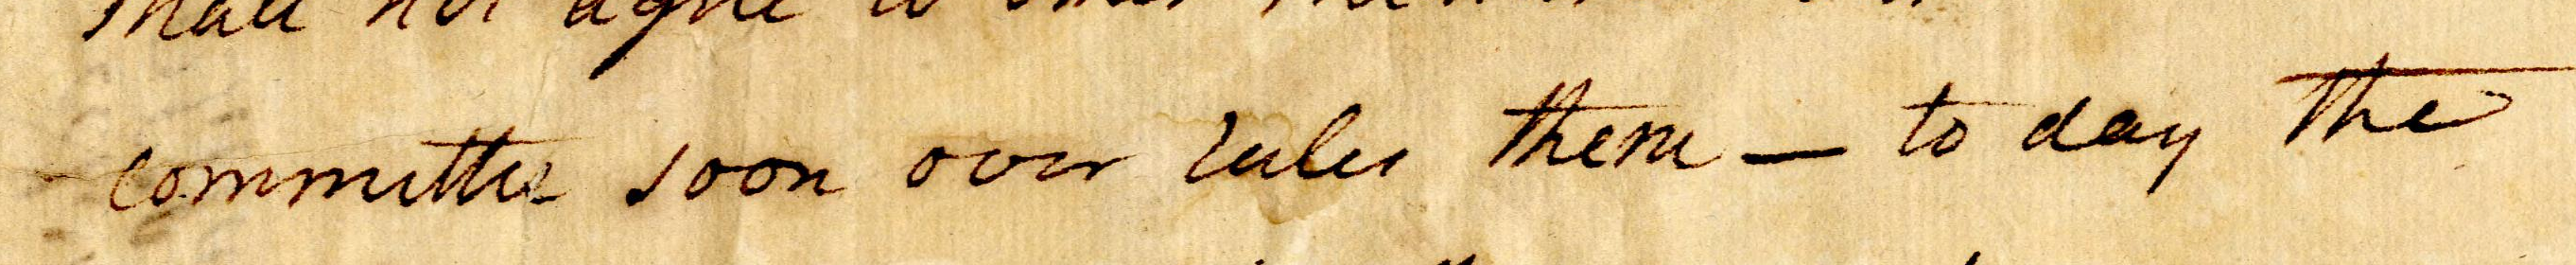committee soon over rules them- to day the
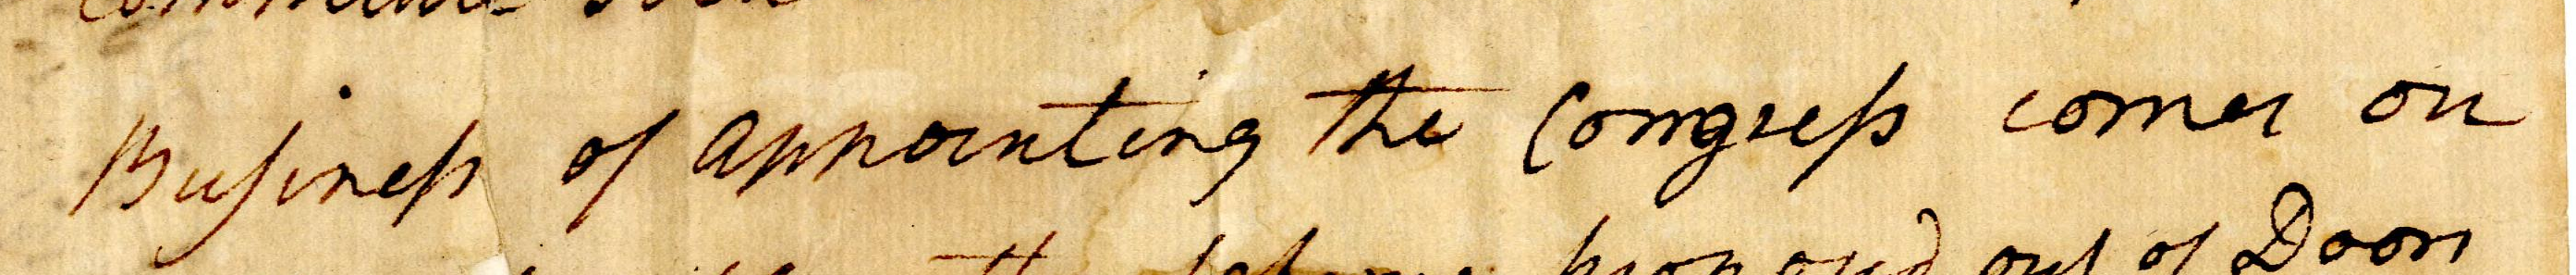Business of appointing the Congress comes on
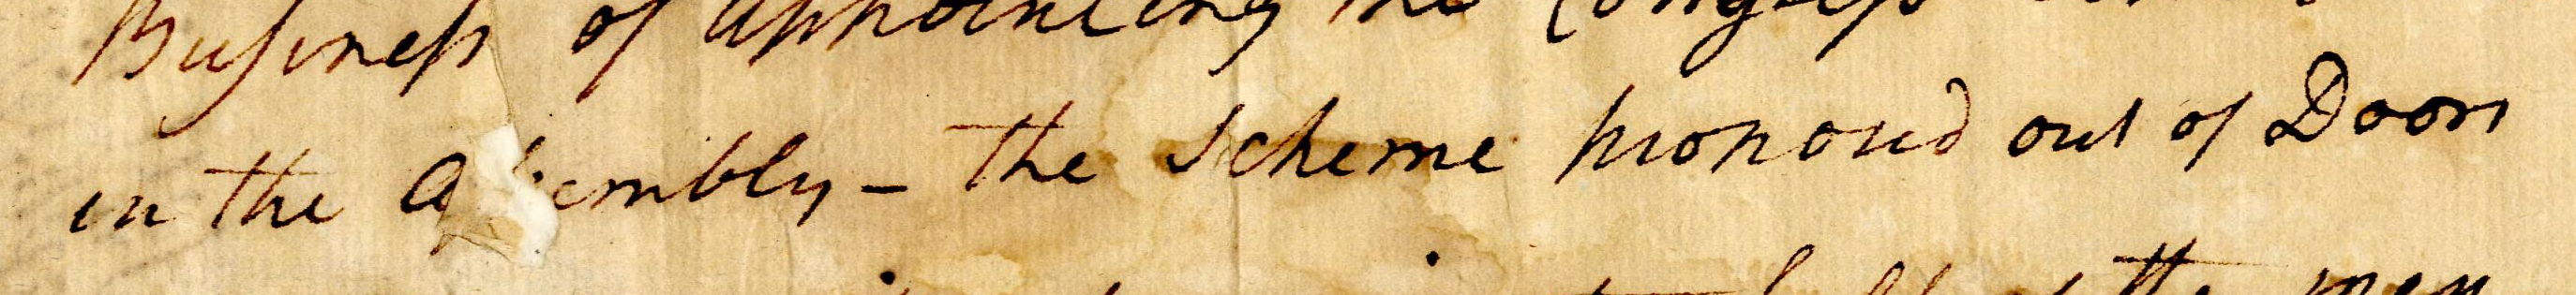in the Assembly- The scheme proposed out of Doors
